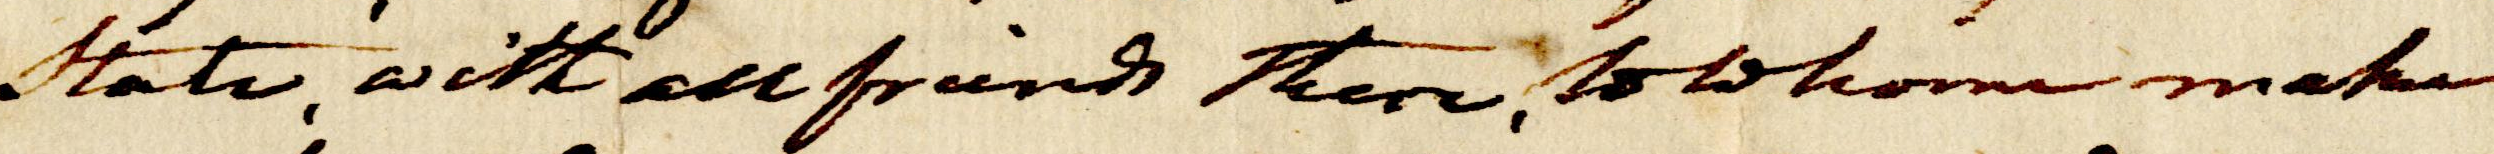State with all friends there, to whome make
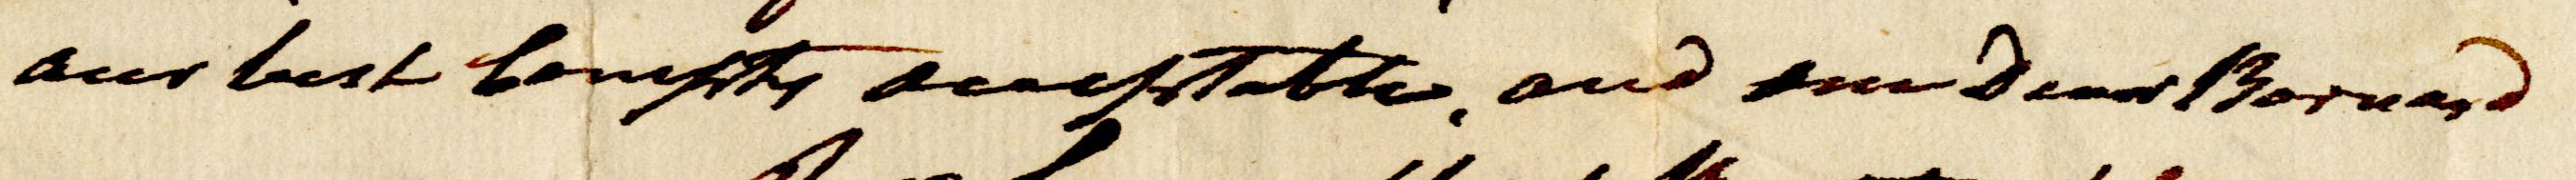our best business acceptable, and am Dear Barnard
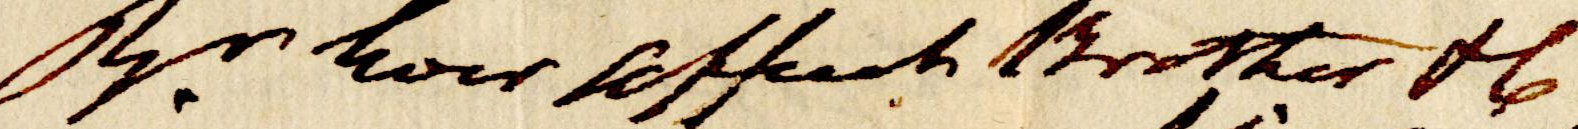y^r Ever affect Brother H
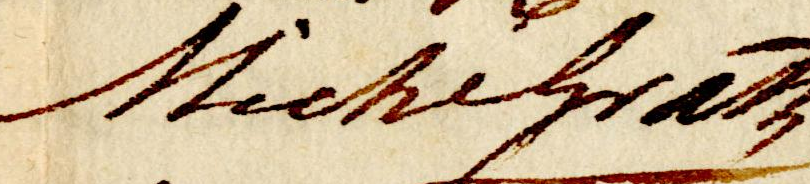Mich^l Gratz
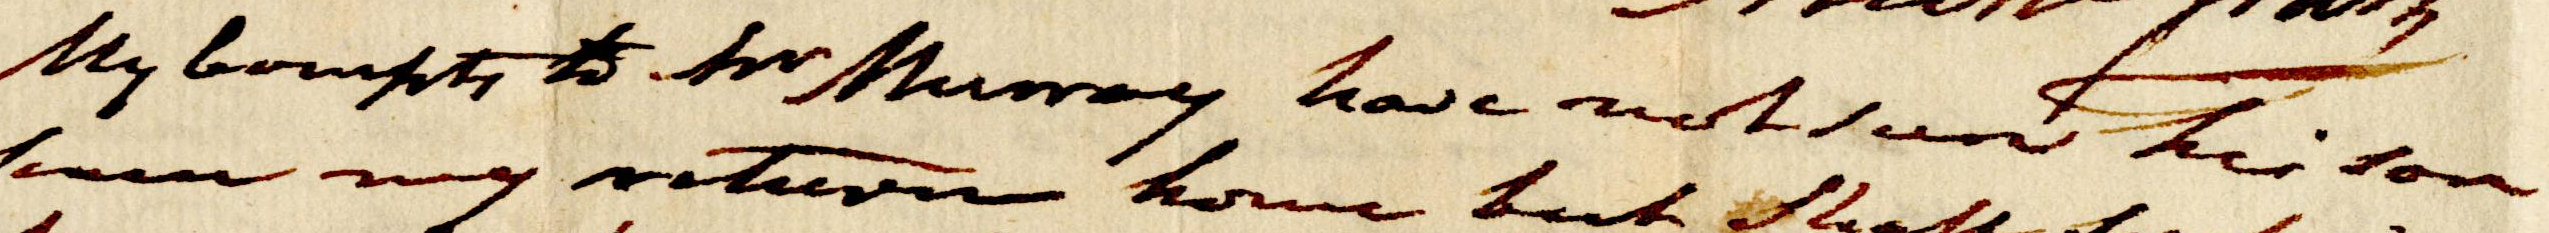my Compts to M^r Murray have not seen his son
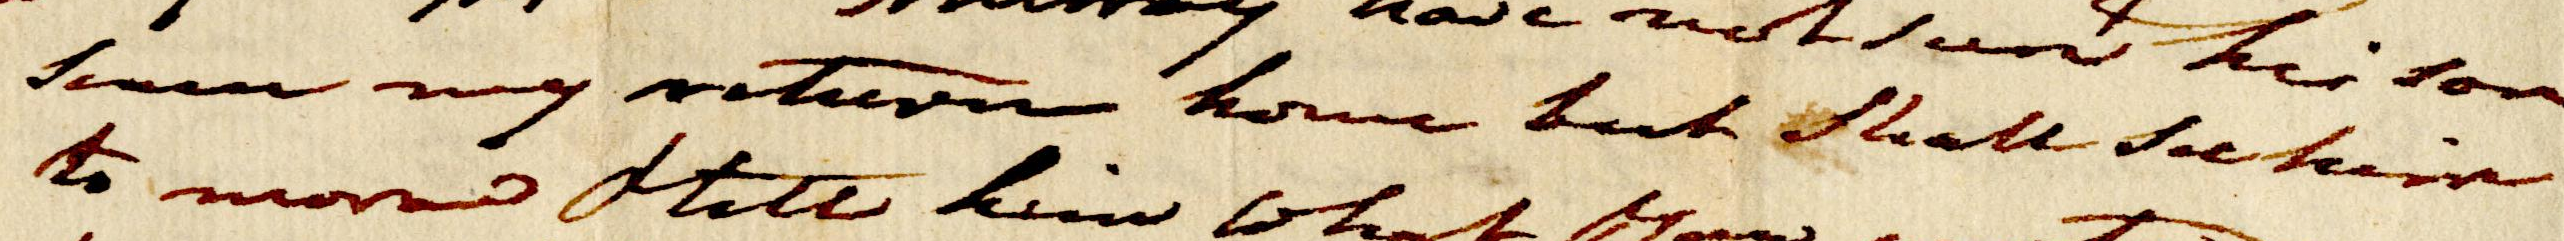since my return home but shall see him
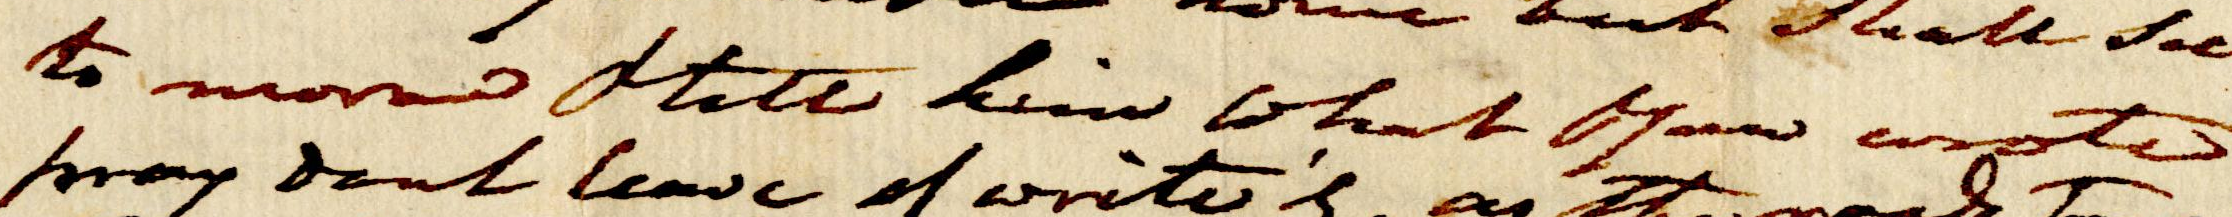to morrow & tell him what you wrote
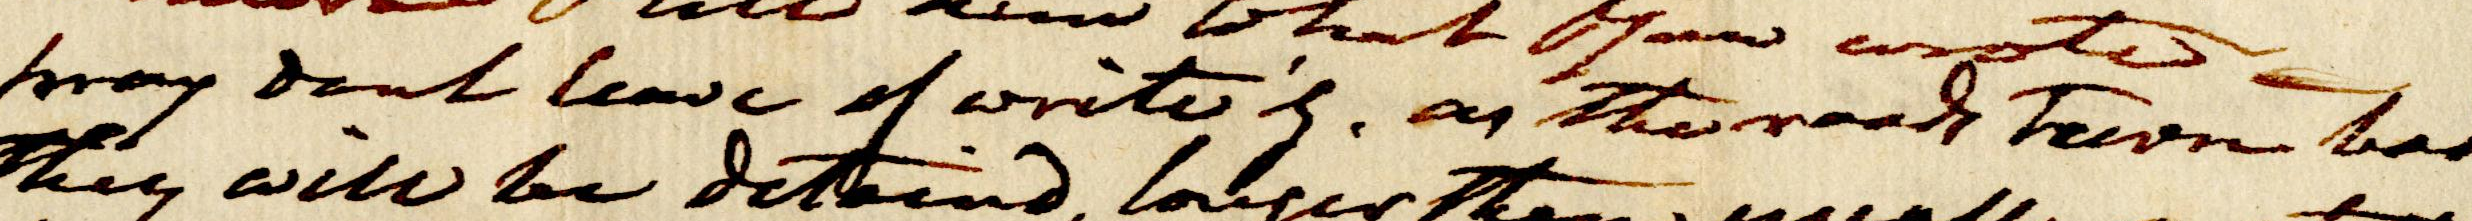pray dont leave of write'g as the roads there bad
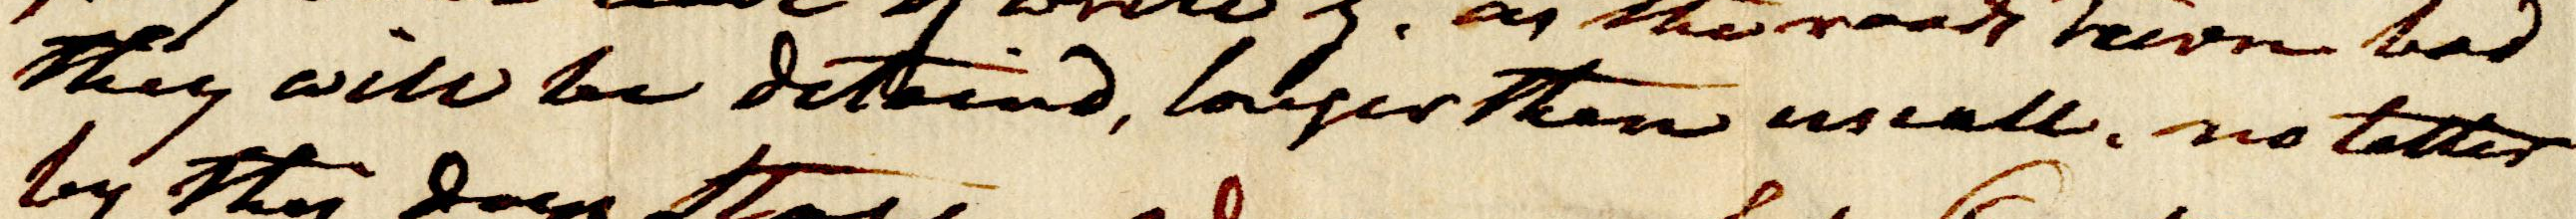they will be detaind, larger than usuall. no letter
